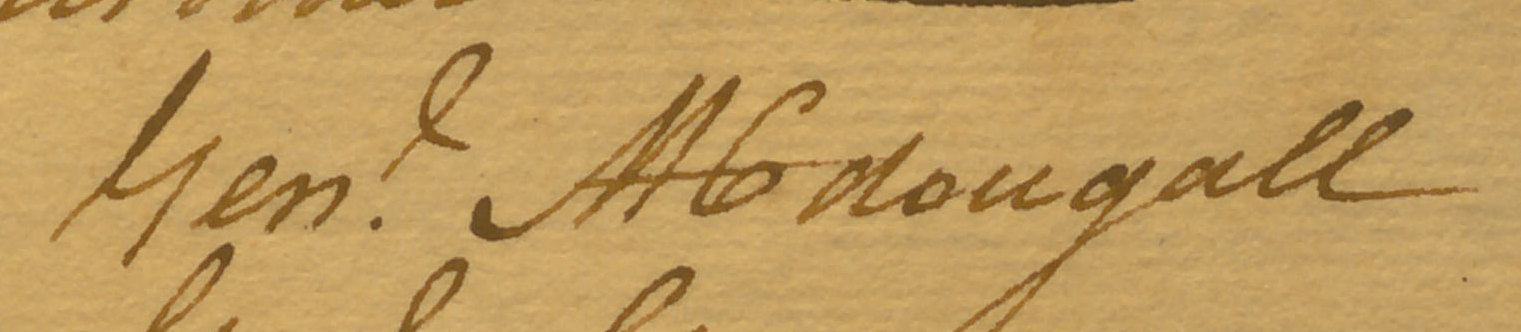Gen^l. MCdougall
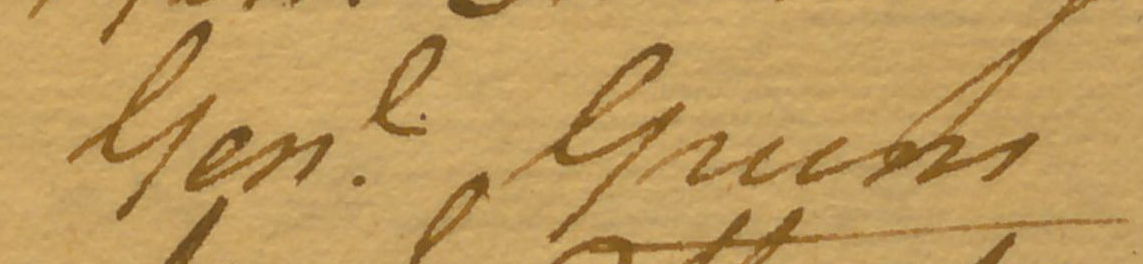Gen^l. Greens
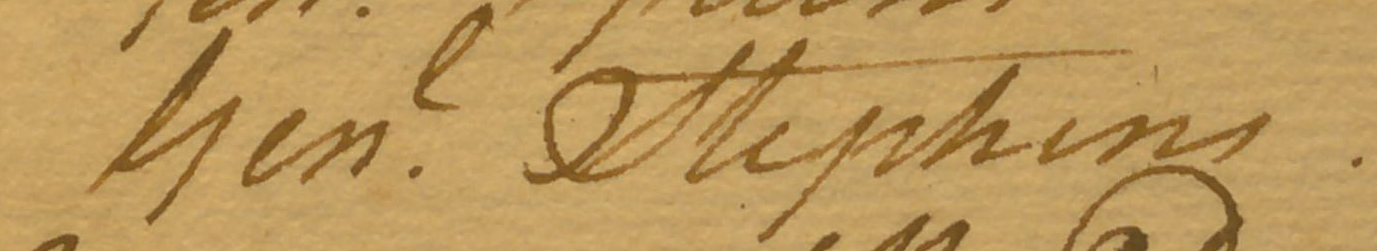Gen^l. Stephens
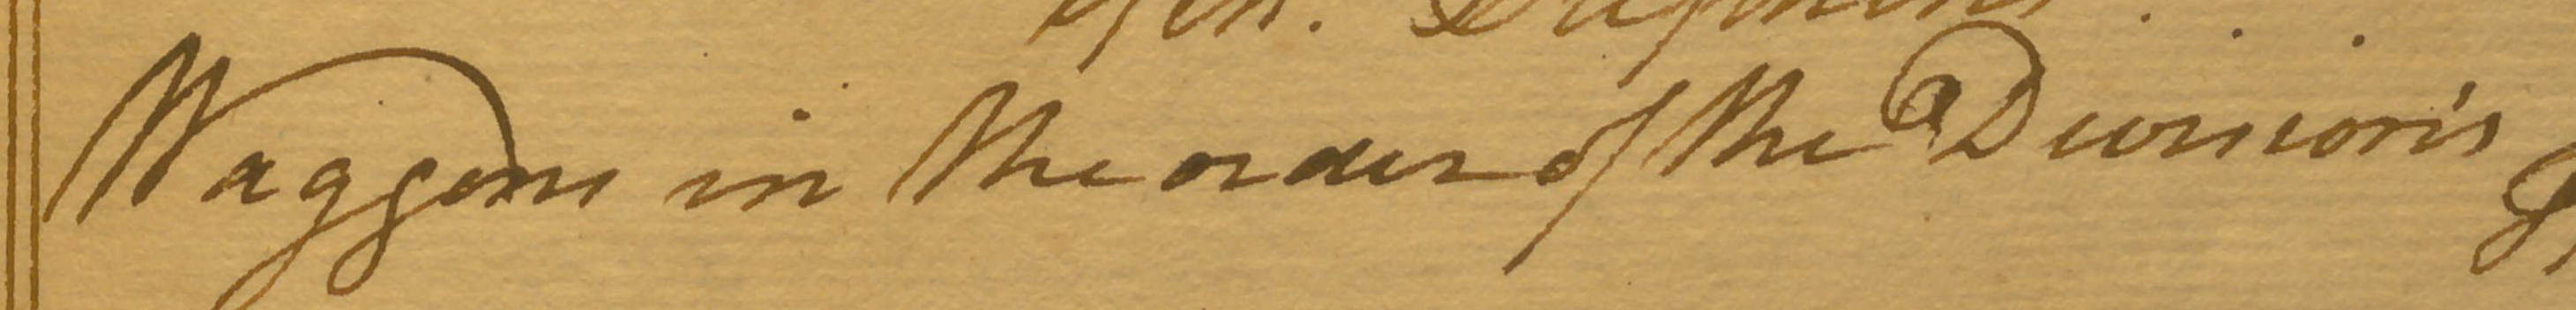Waggons in the order of Divisions
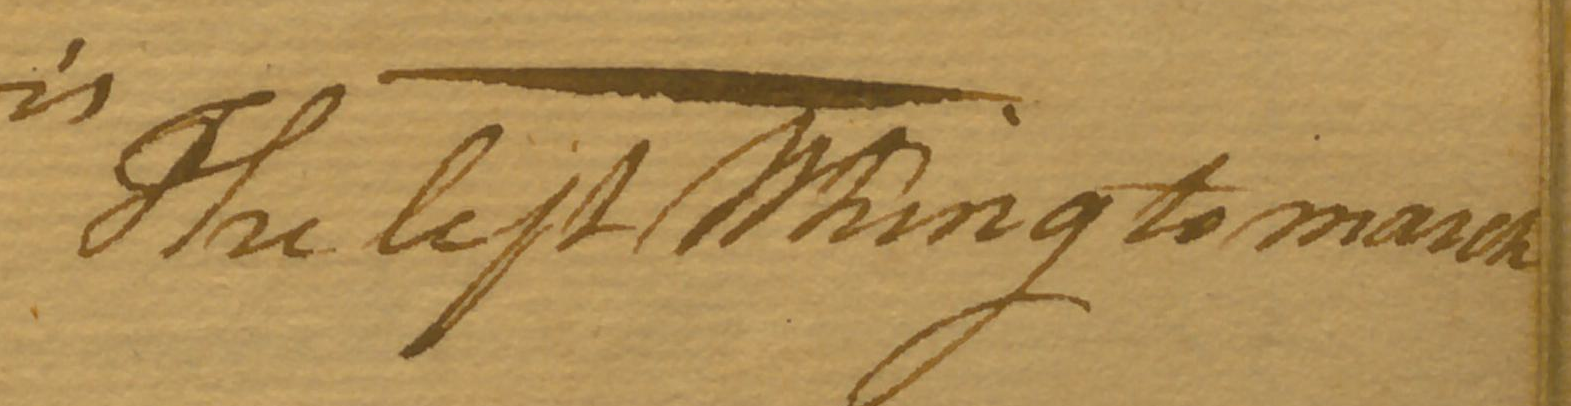The left Whing to march
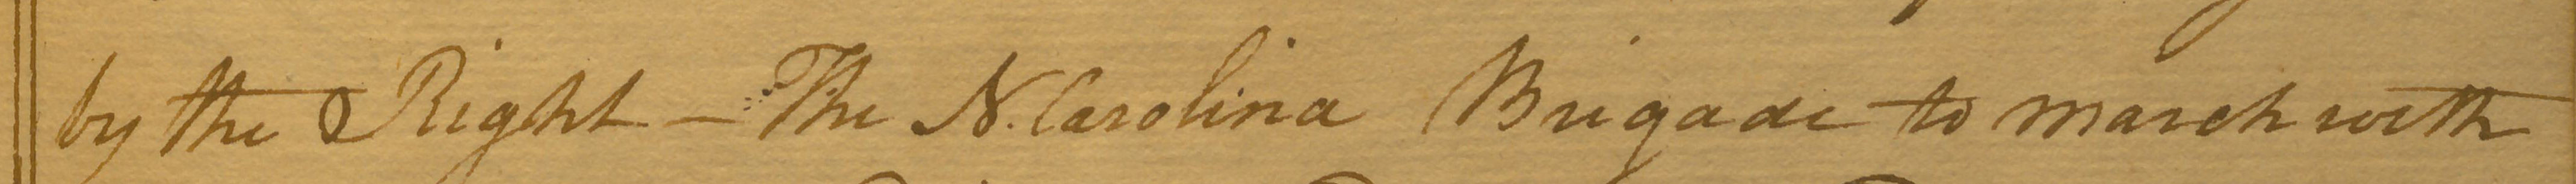by the Right- The N. Carolina Brigade to march with
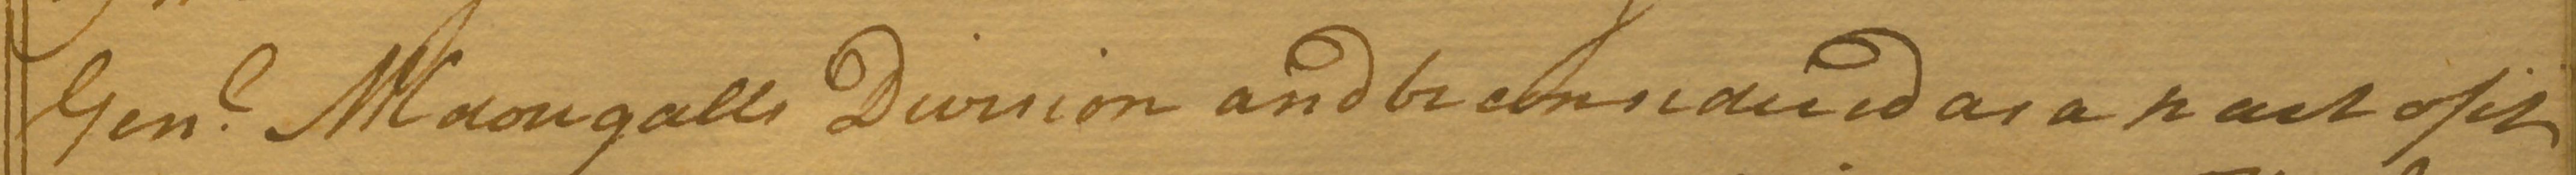Gen^l. MCdougalls Division and be considered as a part of it
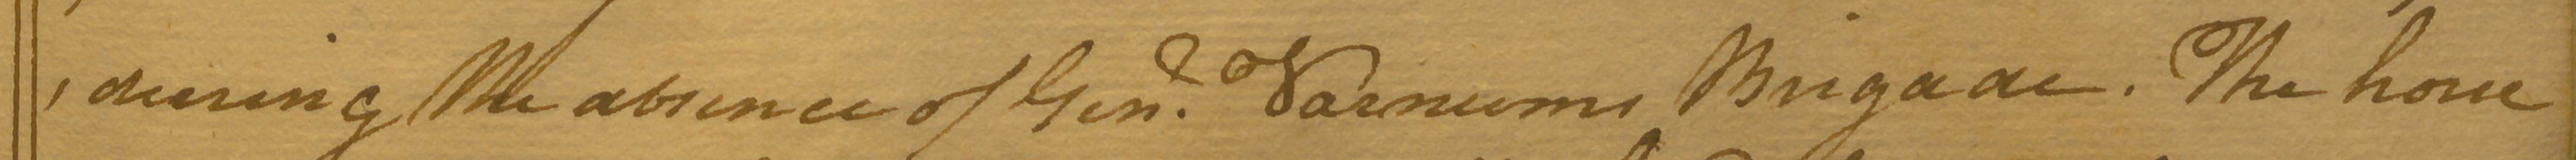, during the absence of Gen^l. Varnums Brigade. The horse
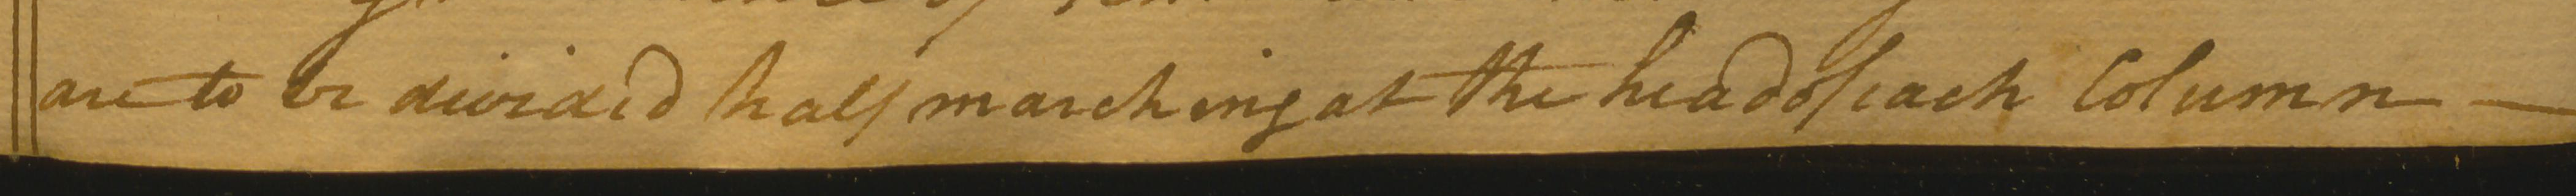are to be divided half marching at the head of each Column-
